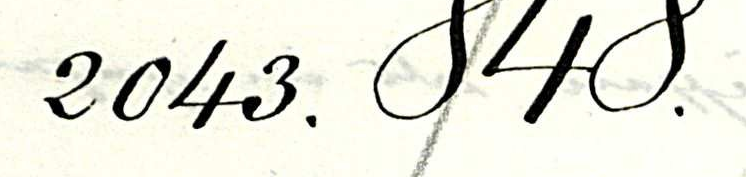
2043 848
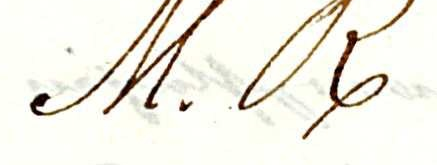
MR
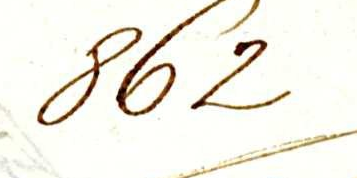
862
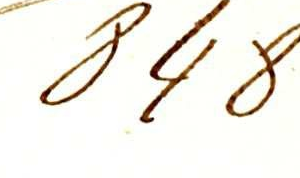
/848
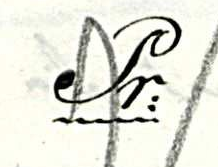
Pr
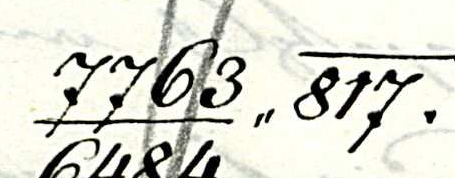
7763/ “ 817
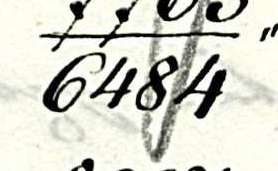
6484
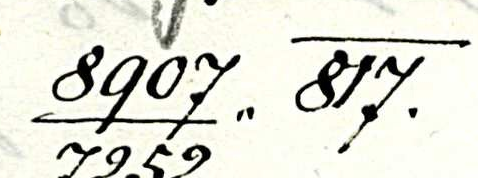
8907/ “ 817
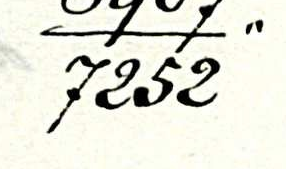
7252
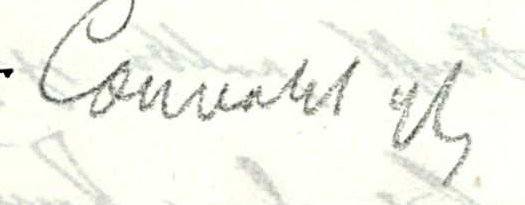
Convetet scribble
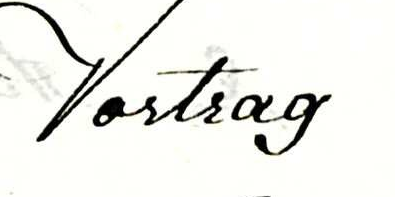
Vortrag
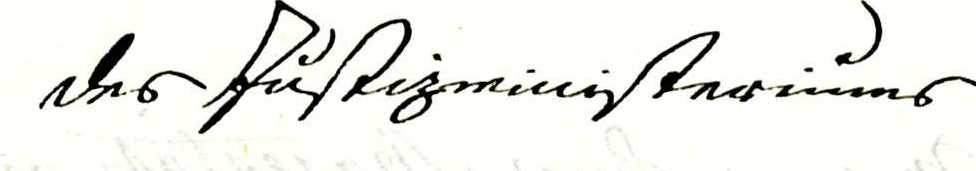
des Justizministeriums
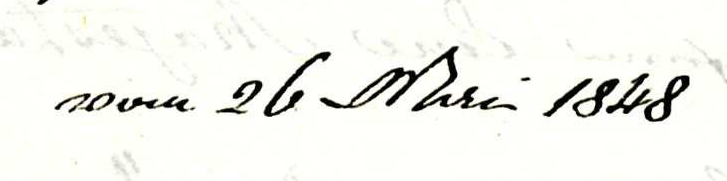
vom 26. Mai 1848
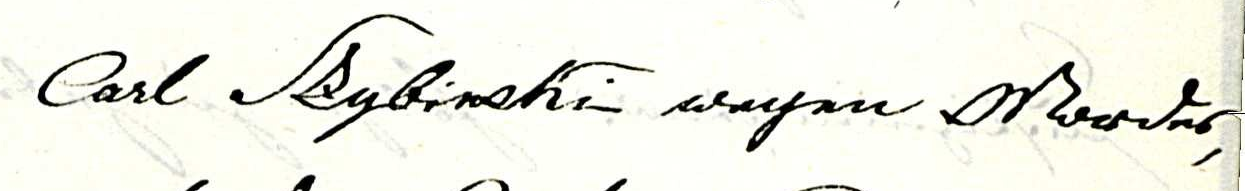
Carl Szybinski wegen Mordes,
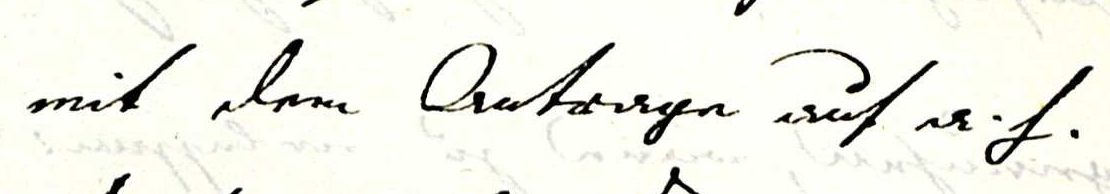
mit dem Antrage auf a.h.
